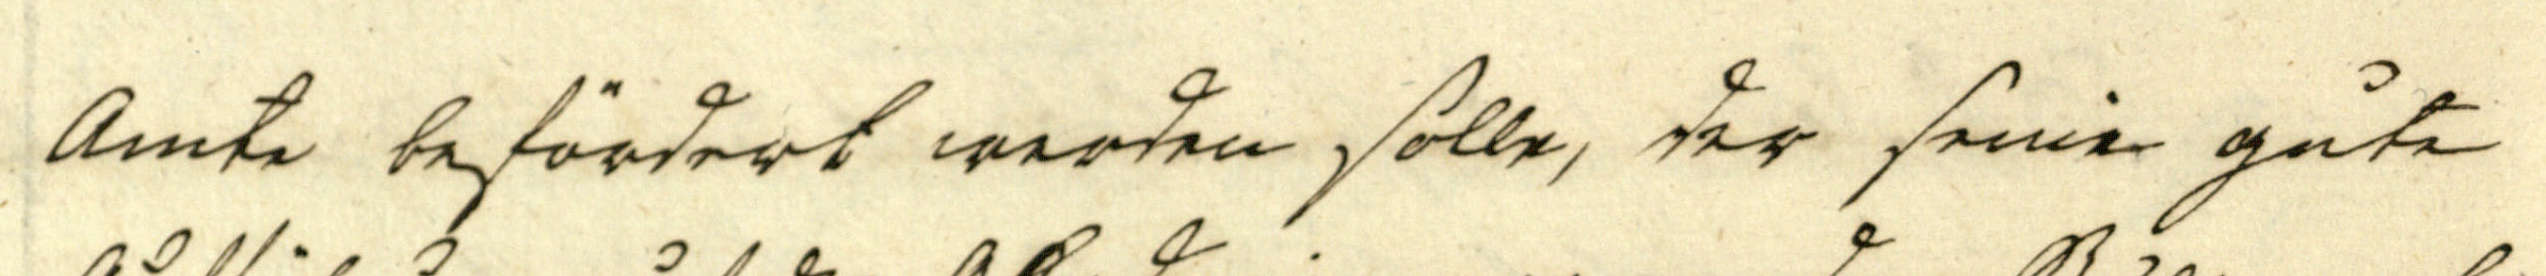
Amte befördert werden solle, der seine gute
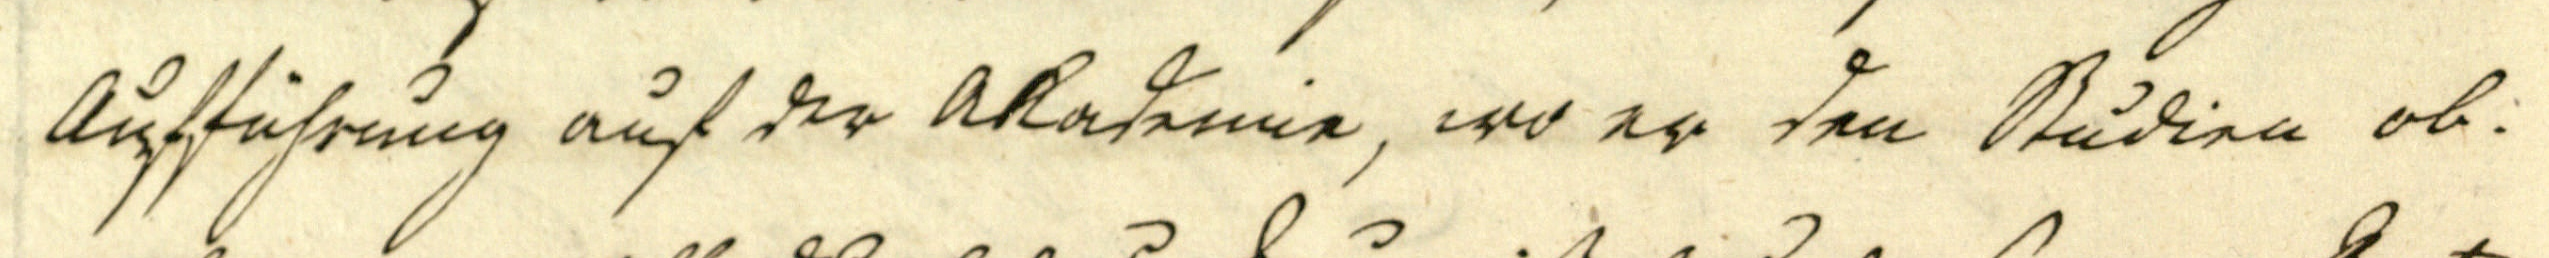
Aufführung auf der Akademie, wo er den Studien ob¬
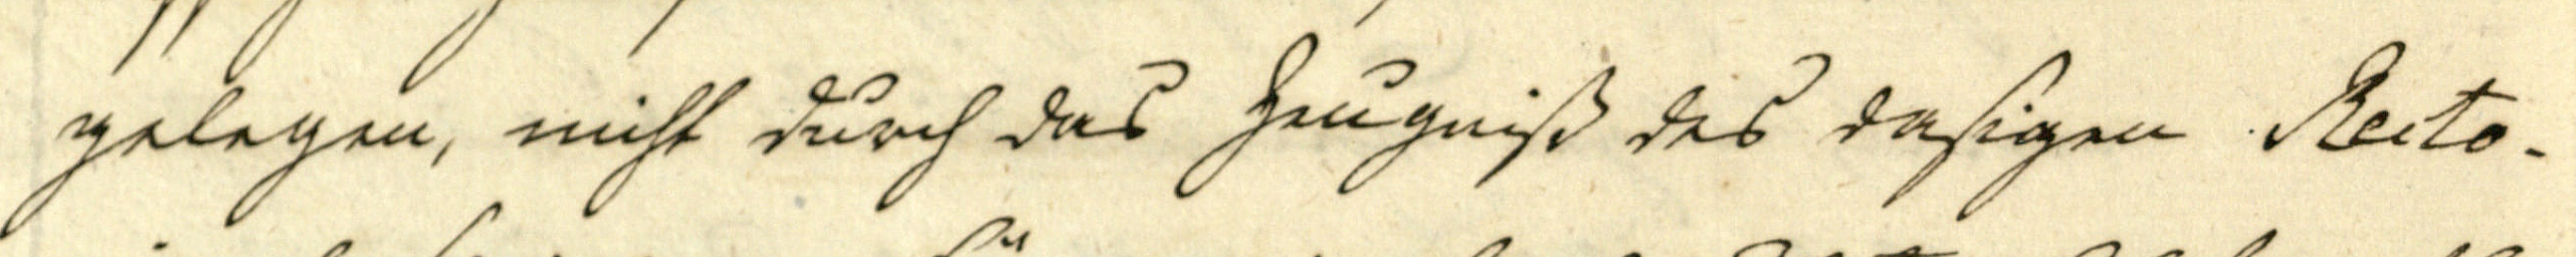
gelegen, nicht durch das Zeugniß des dasigen Recto¬
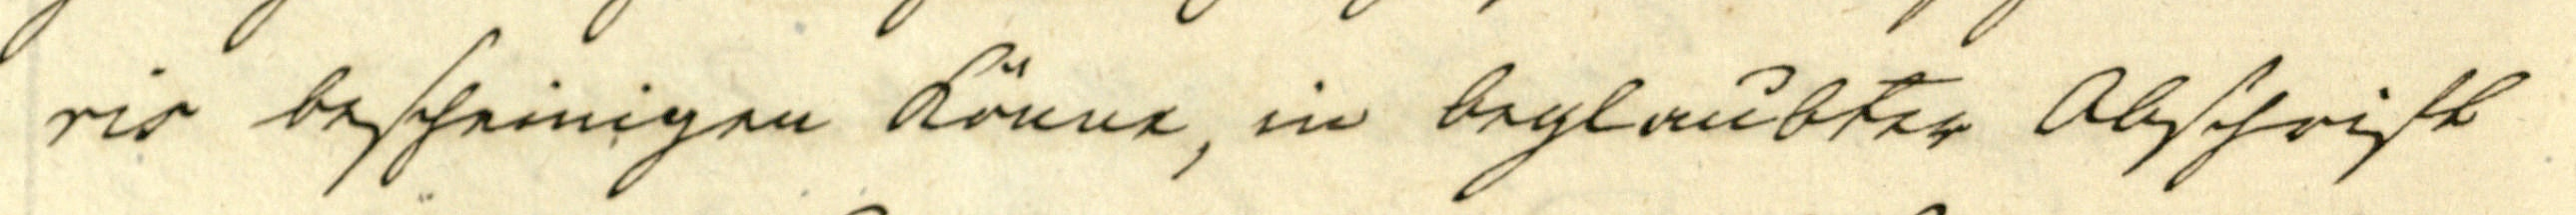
ris bescheinigen könne, in beglaubter Abschrift
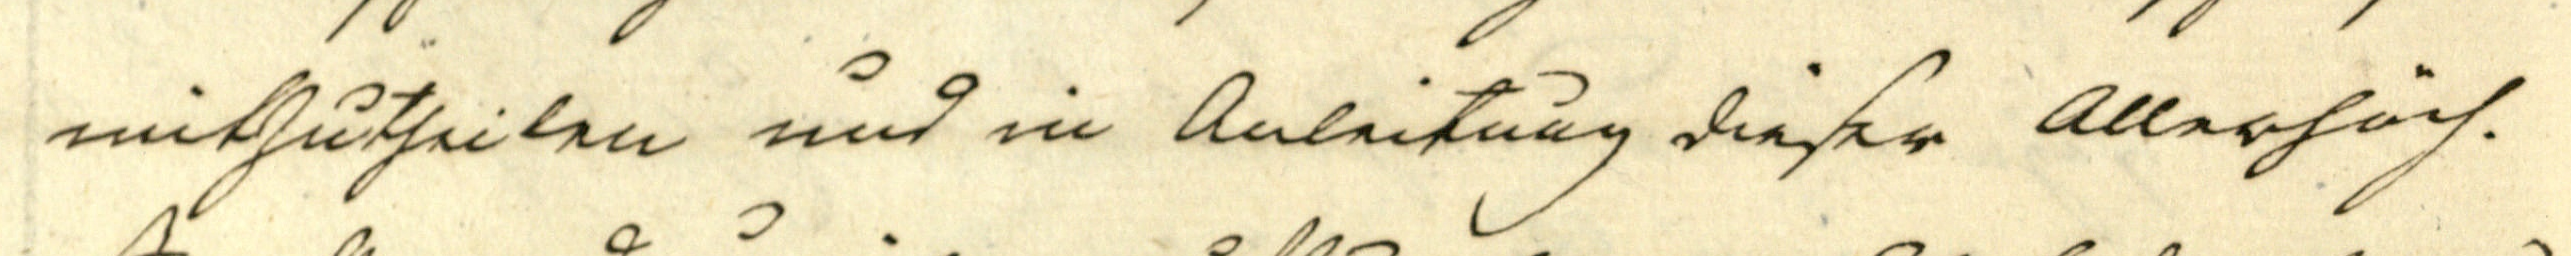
mitzutheilen und in Anleitung dieser Allerhöch¬
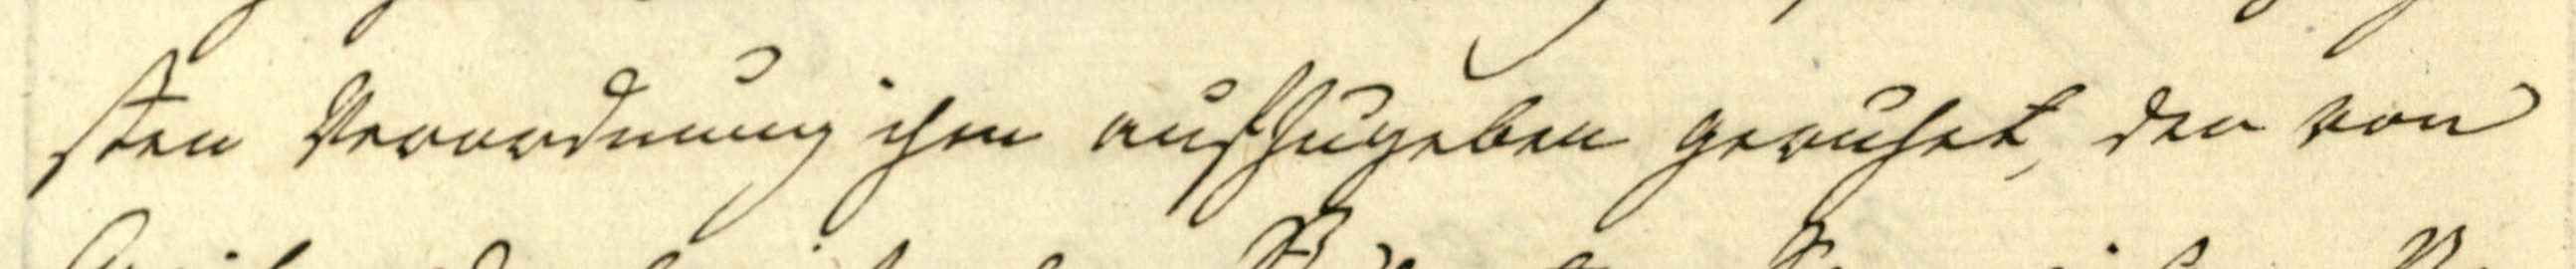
sten Verordnung ihm aufzugeben geruhet, den von
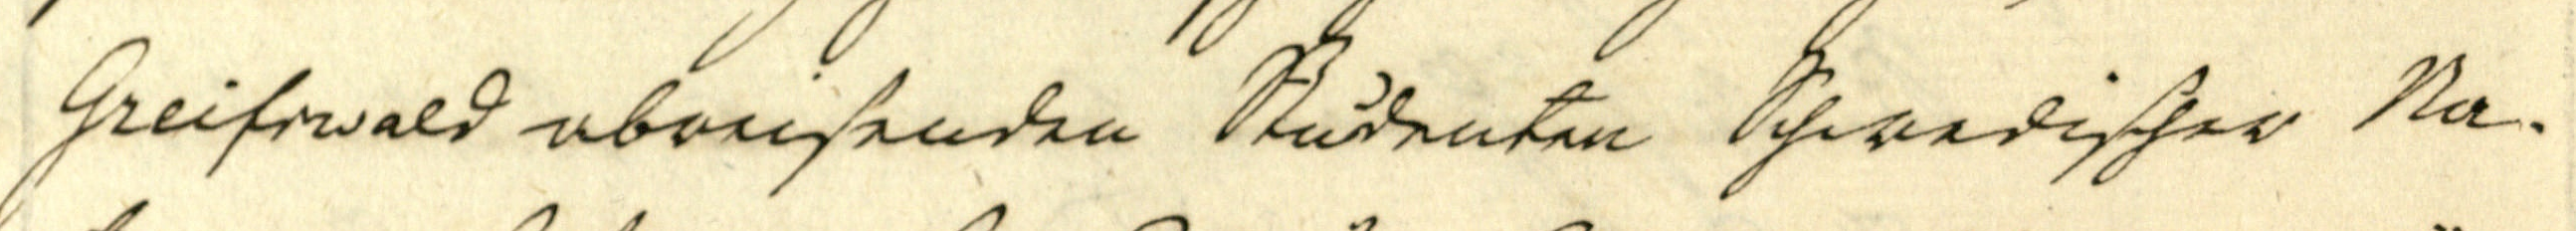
Greifswald abreisenden Studenten Schwedischer Na¬
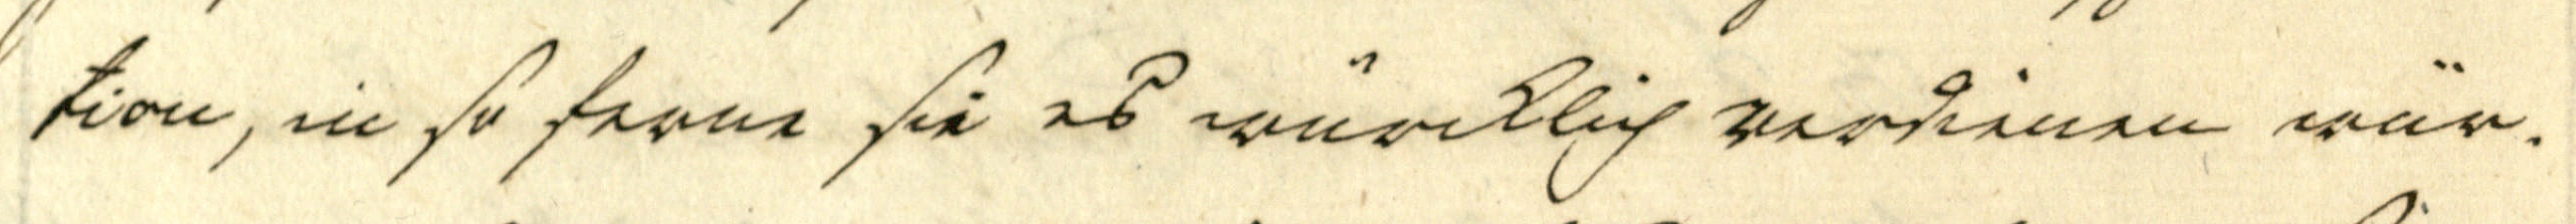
tion, in so ferne sie es würcklich verdienen wür¬
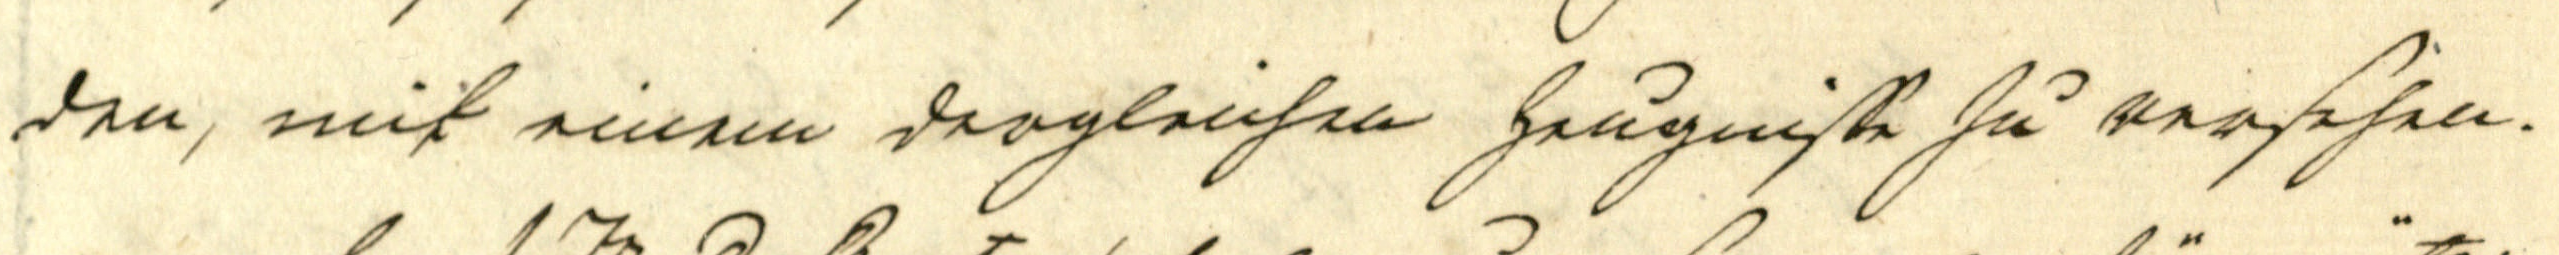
den, mit einem dergleichen Zeugnisse zu versehen.
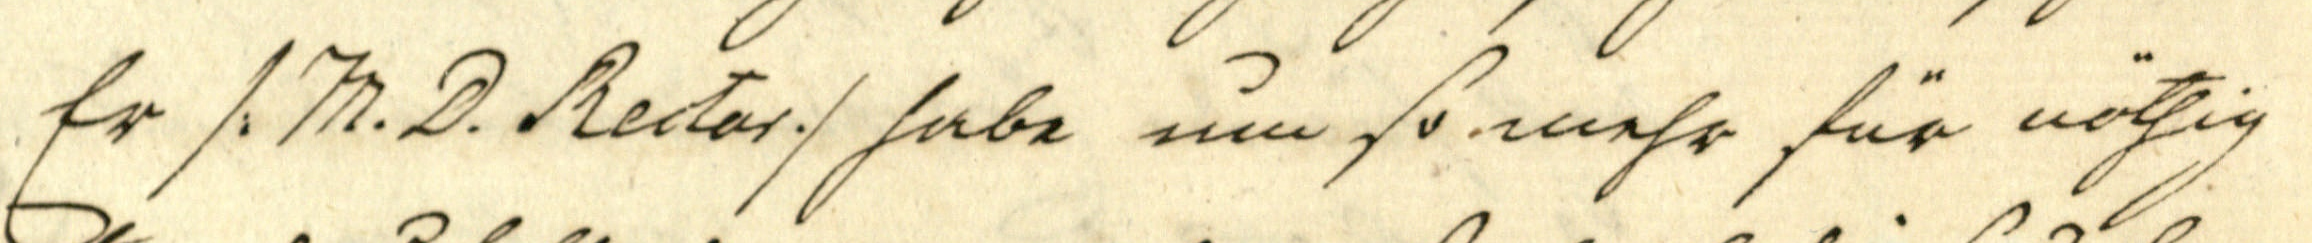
Er /. M. D. Rector ./ habe um so mehr für nöthig
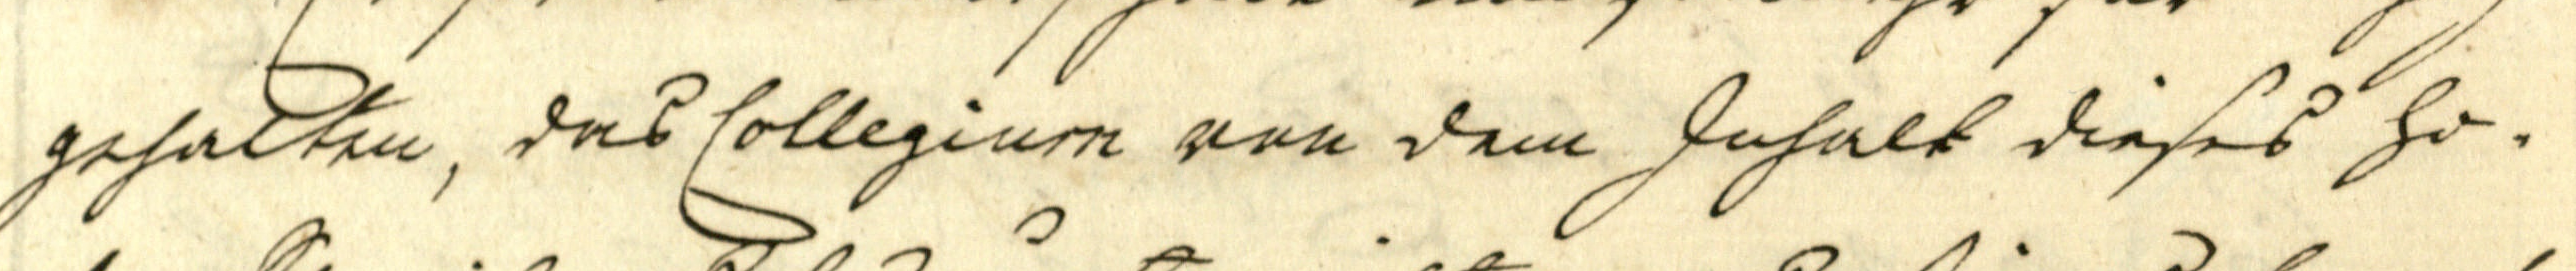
gehalten, das Collegium von dem Inhalt dieses ho¬
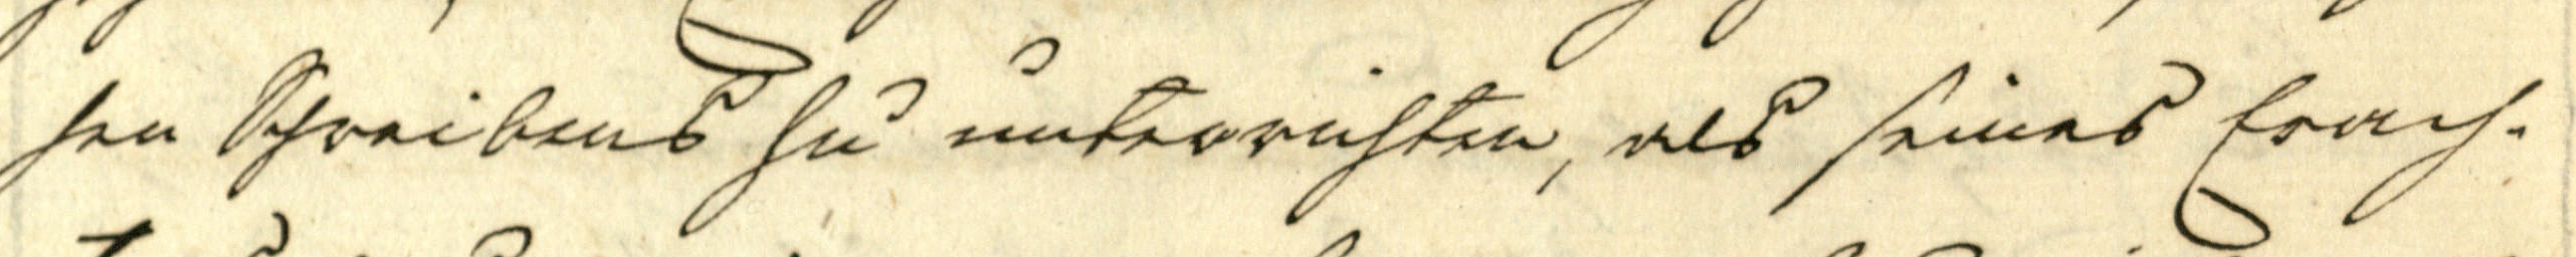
hen Schreibens zu unterrichten, als seines Erach¬
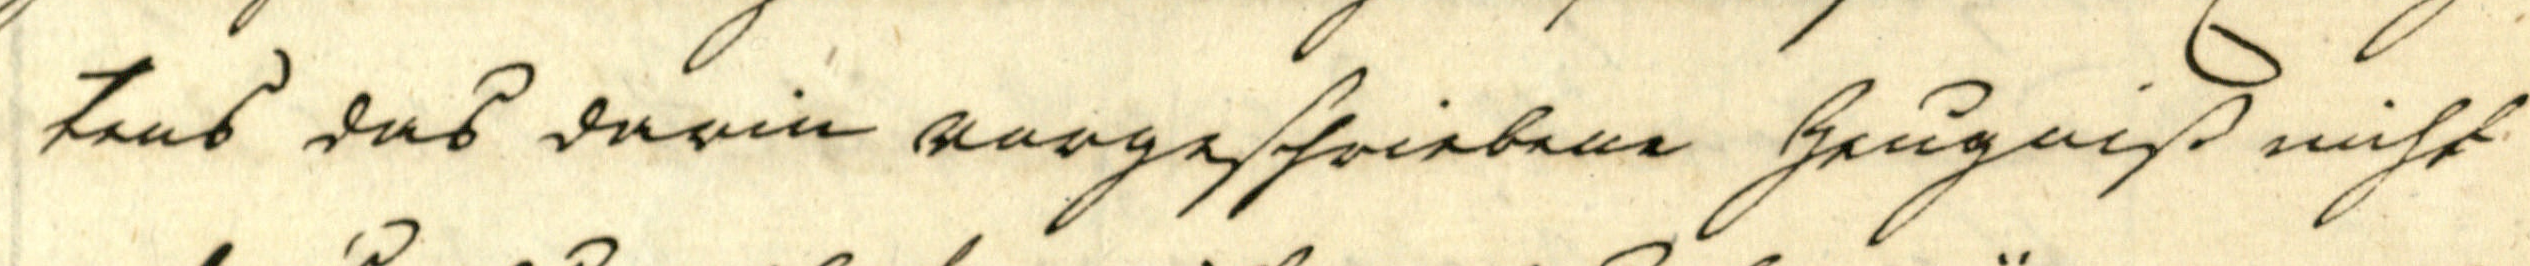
tens das darin vorgeschriebene Zeugniß nicht
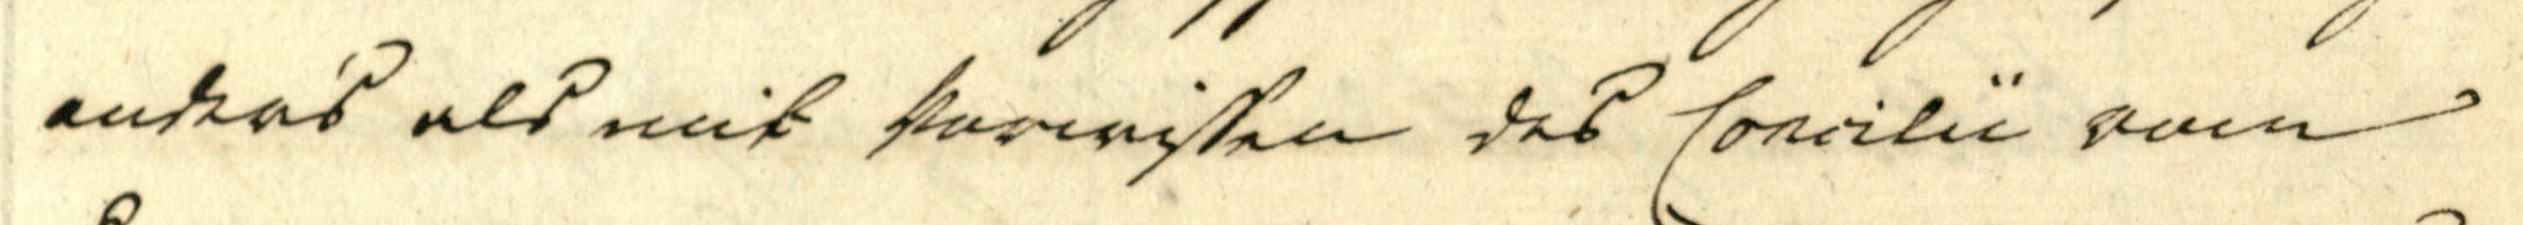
anders als mit Vorwissen des Concilii vom
